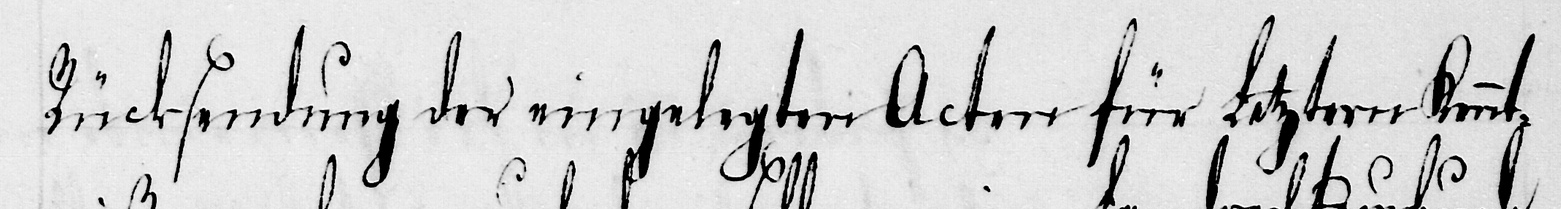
Rücksendung der eingelegten Acten für Letztern Ken¬
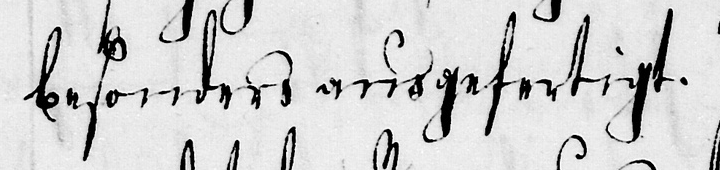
besonders ausgefertigt.
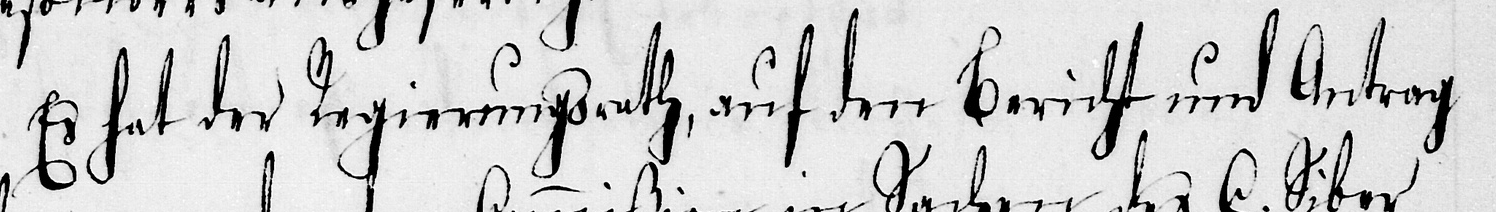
Es hat der Regierungsrath, auf den Bericht und Antrag
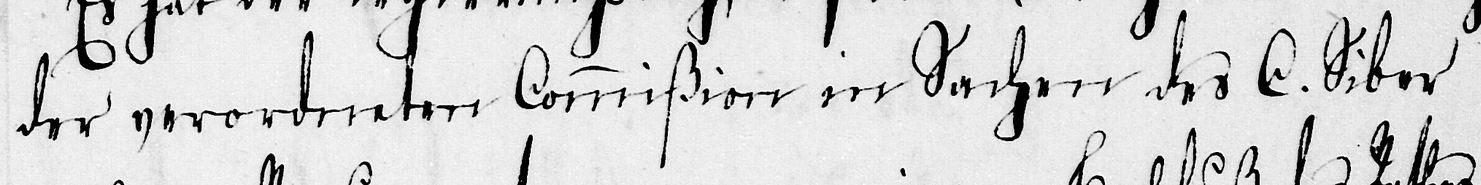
der verordneten Commißion in Sachen des C. Siber
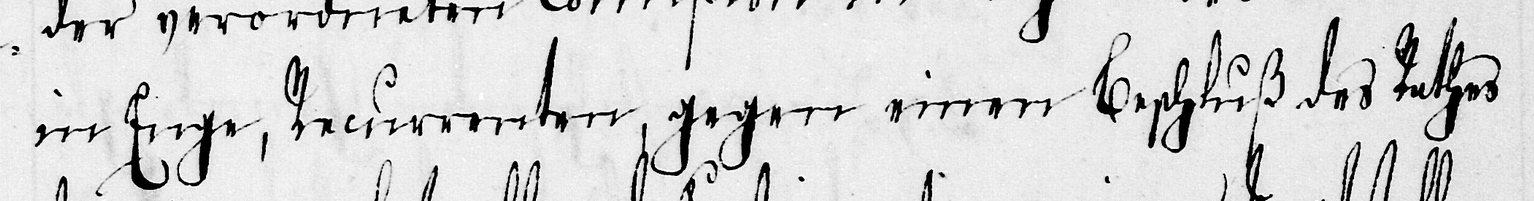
in Enge, Recurrenten, gegen einen Beschluß des Rathes
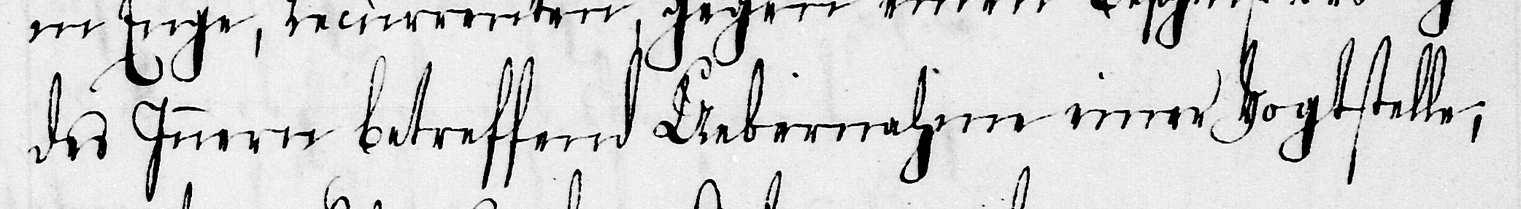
des Innern betreffend Uebernahme einer Vogtstelle,
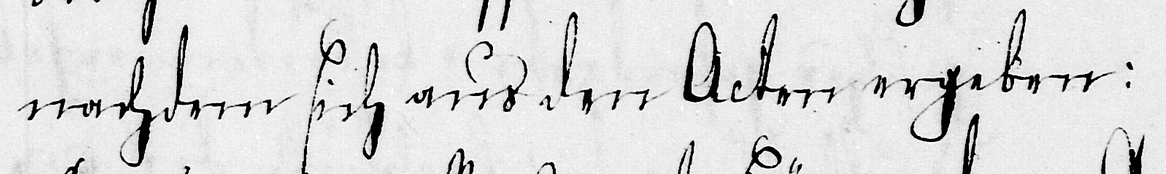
nachdem sich aus den Acten ergeben:
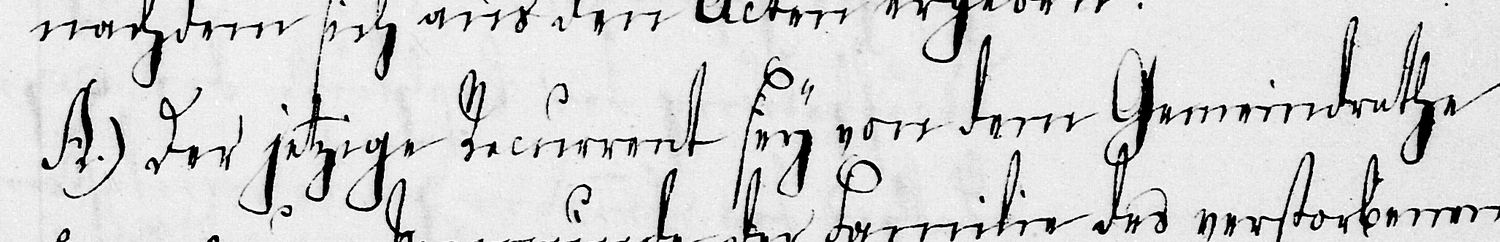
A.) Der jetzige Recurrent sey von dem Gemeindrathe
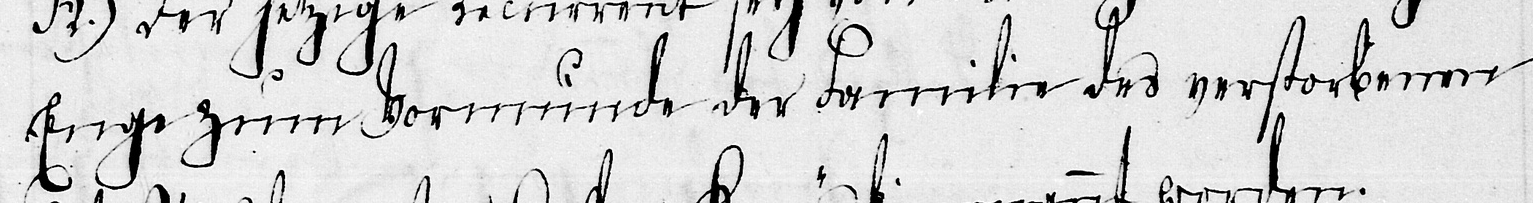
Enge zum Vormunde der Familie des verstorbenen
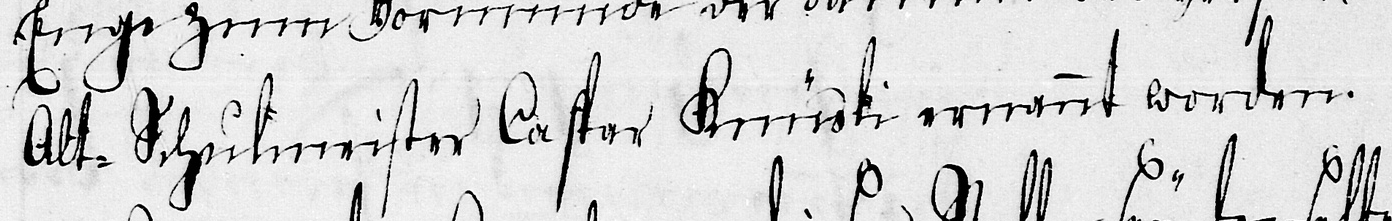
Alt-Schulmeister Caspar Knüsli ernannt worden.
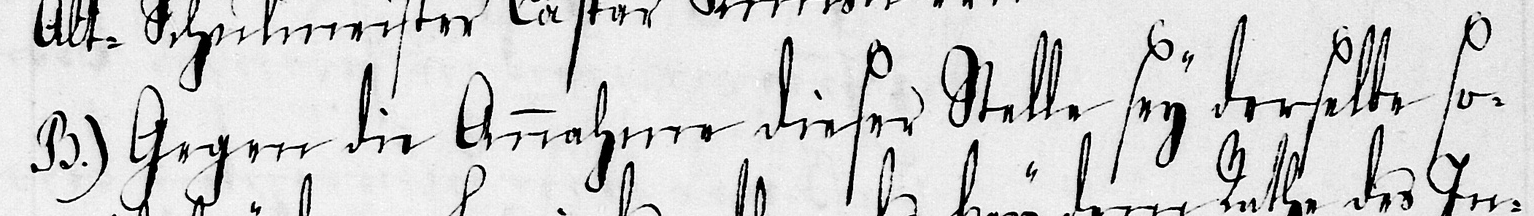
B.) Gegen die Annahme dieser Stelle sey derselbe so¬
